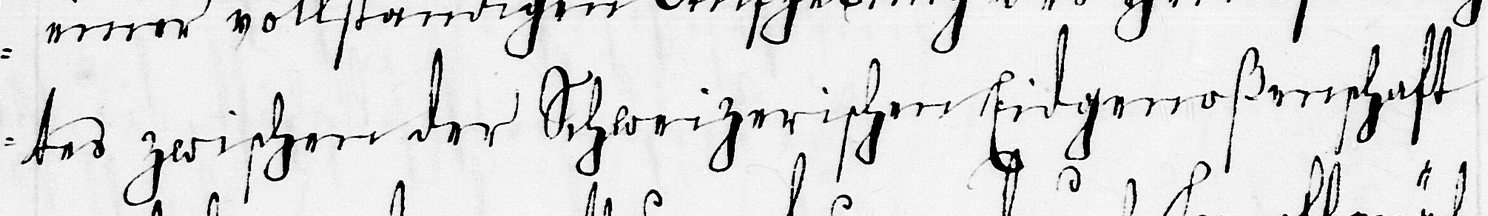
tes zwischen der Schweizerischen Eidgenoßenschaft
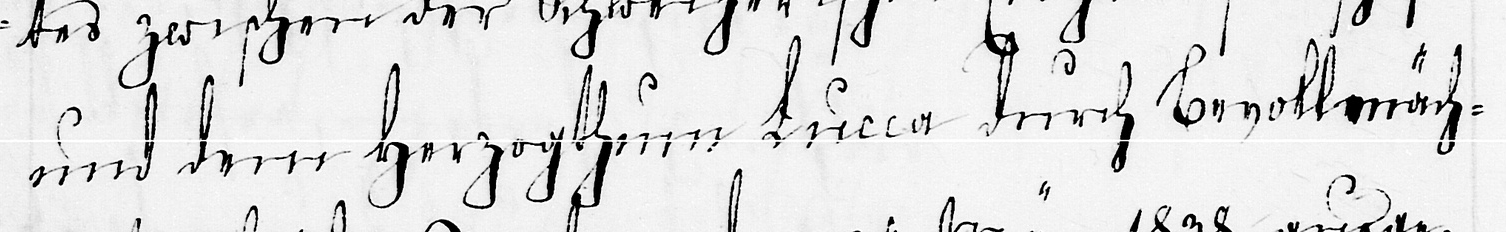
und dem Herzogthum Lucca durch Bevollmäch¬
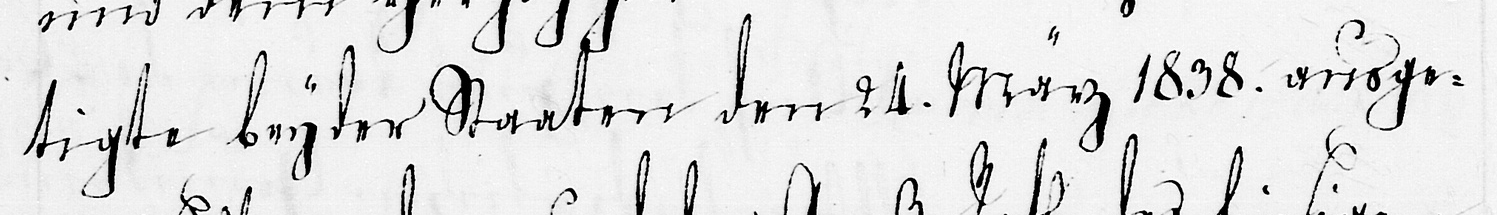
tigte beyder Staaten den 24. März 1838. ausge¬
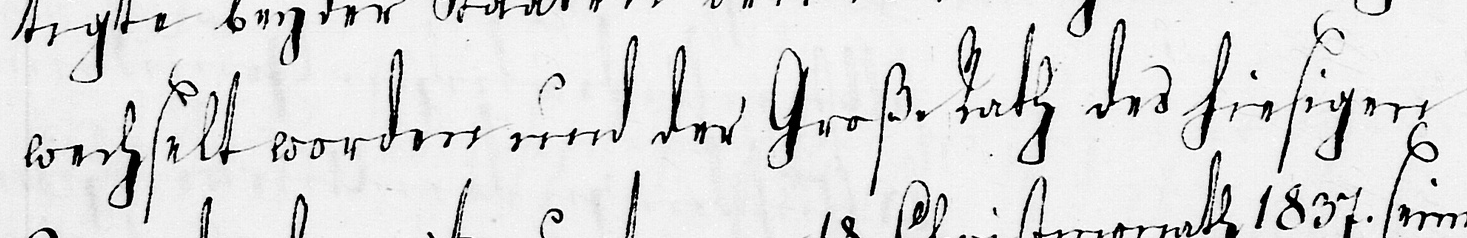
wechselt worden und der Große Rath des hiesigen
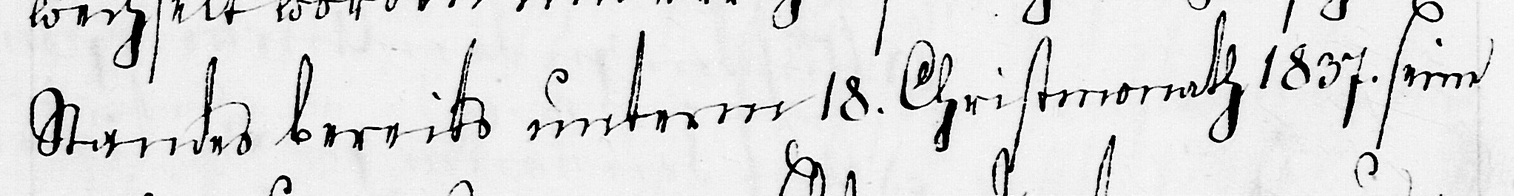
Standes bereits unterm 18. Christmonath 1837. seine
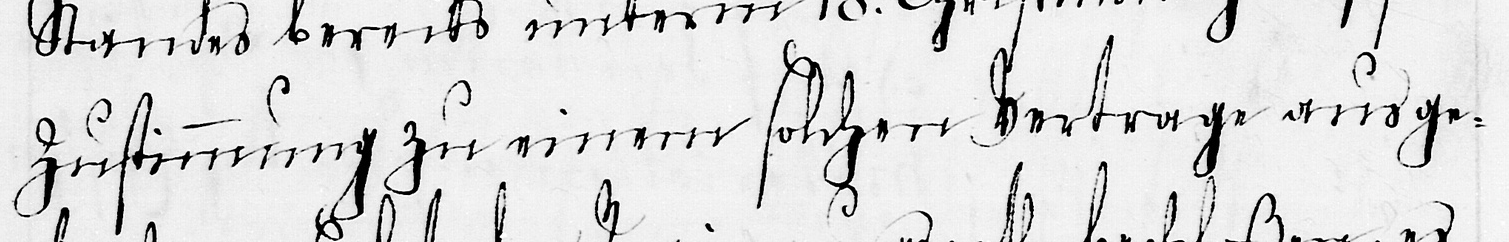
Zustimmung zu einem solchen Vertrage ausge¬
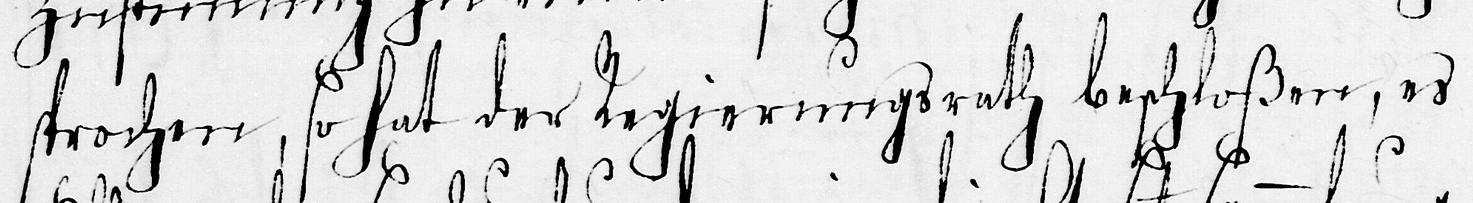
sprochen, so hat der Regierungsrath beschloßen, es
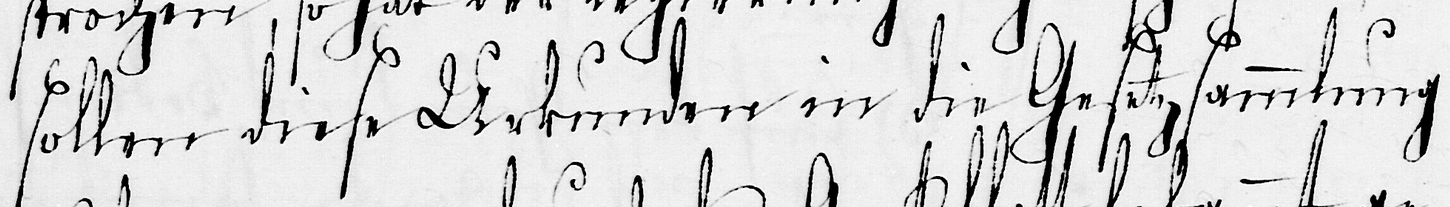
sollen diese Urkunden in die Gesetzsammlung
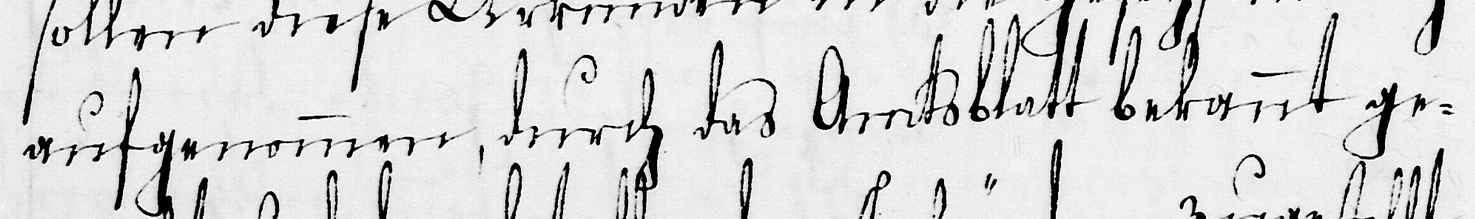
aufgenommen, durch das Amtsblatt bekannt ge¬
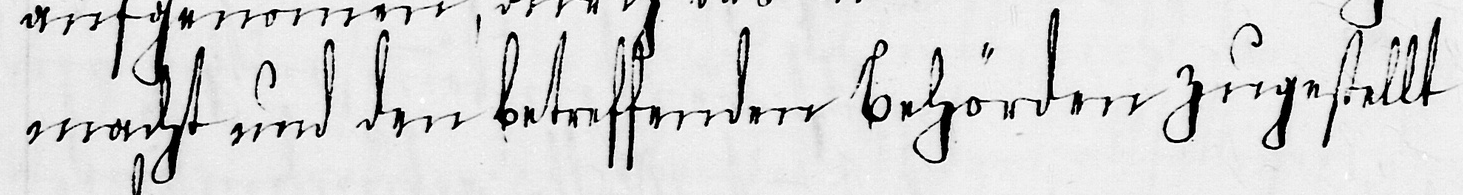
macht und den betreffenden Behörden zugestellt
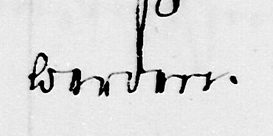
werden.
